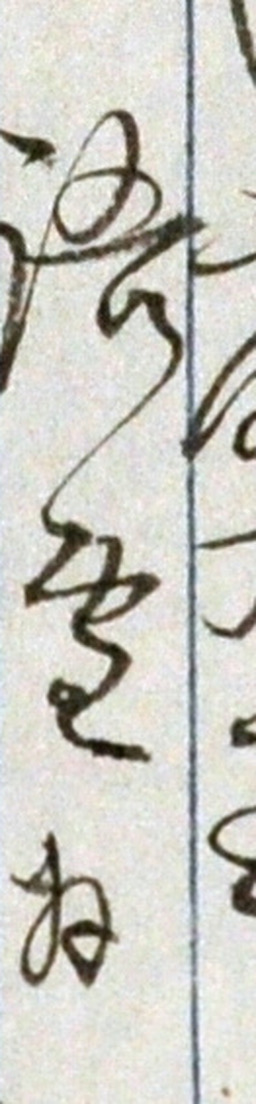語遵拝
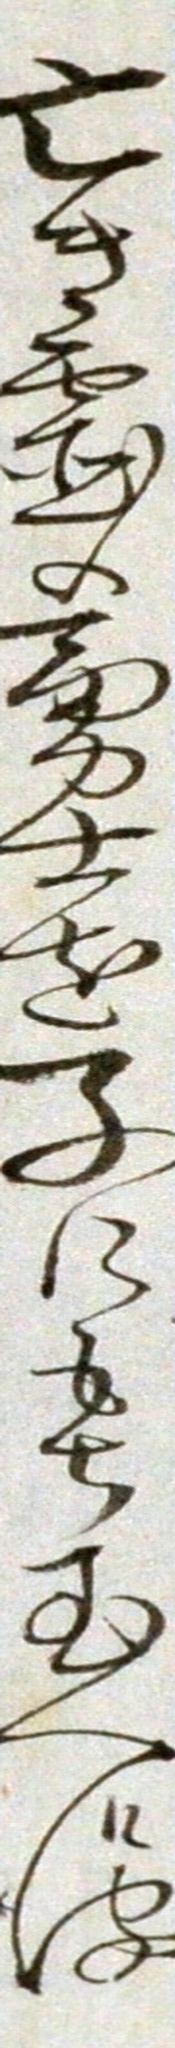亡き霊の勇士を子にもち玉へㇽ波
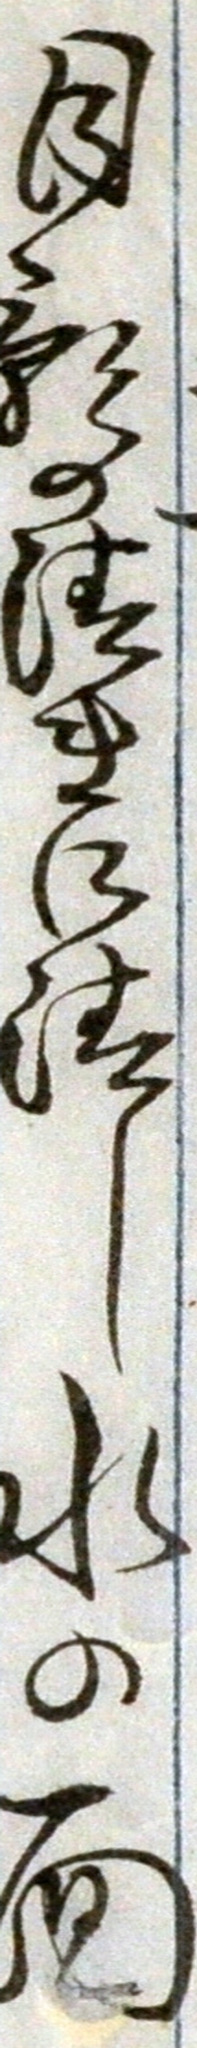月影の清きに清し水の面
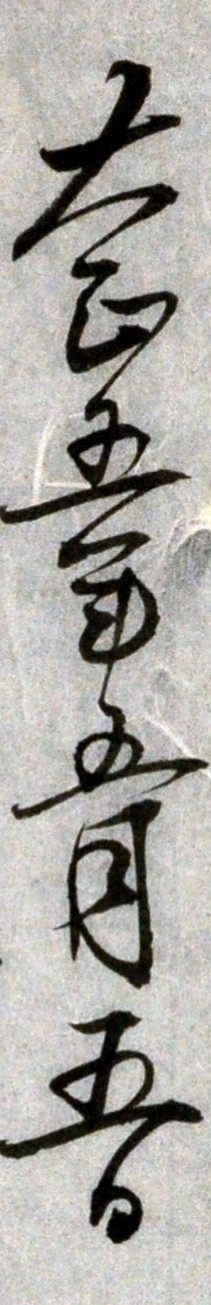大正五年五月五日
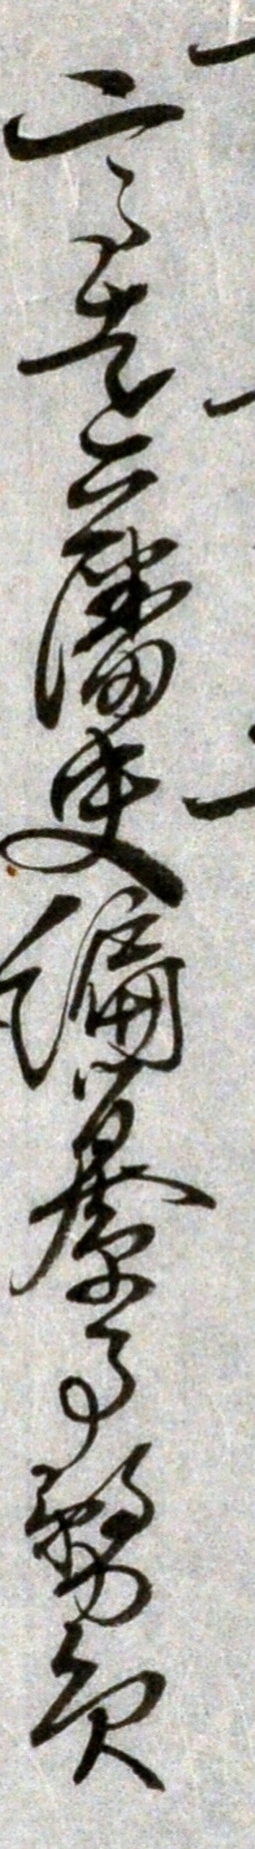高遠藩史編纂事務員
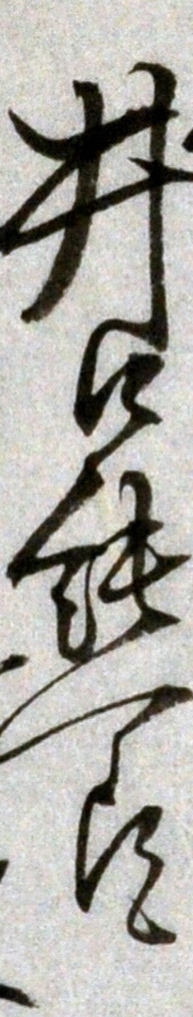井口純一郎
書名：川面小藤太子細有之多賀谷唯右衛門ヲ打果候一件
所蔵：伊那市立高遠町図書館・合同会社AMANE
